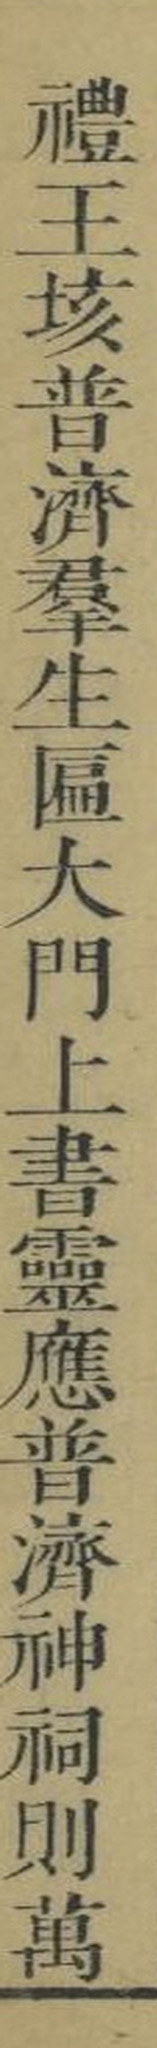禮王垓普濟羣生匾大門上書靈應普濟神祠則萬

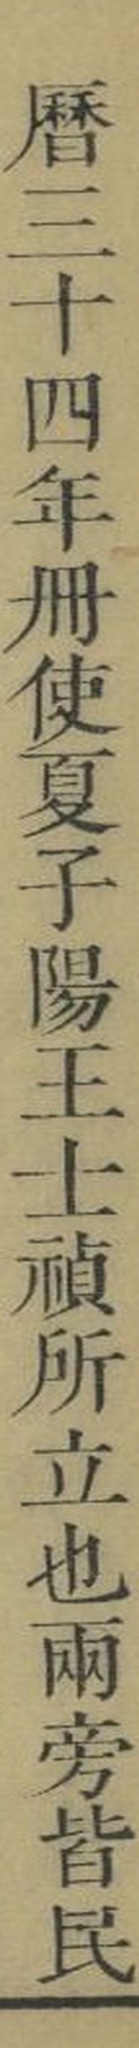曆三十四年冊使夏子陽王士禎所立也兩旁皆民
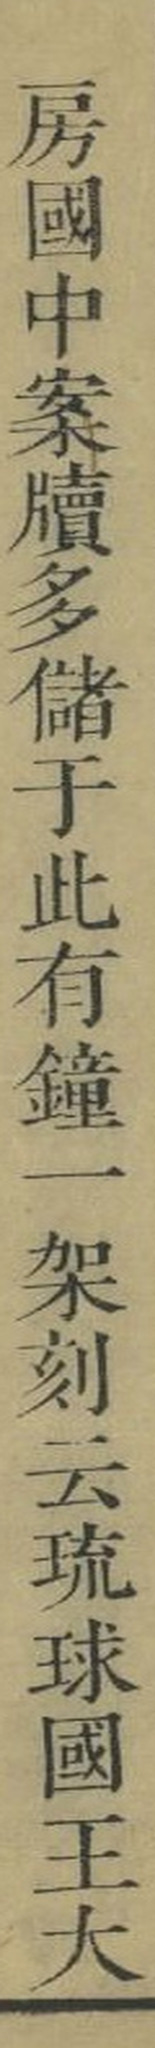房國中案牘多儲于此有鐘一架刻云琉球國王大
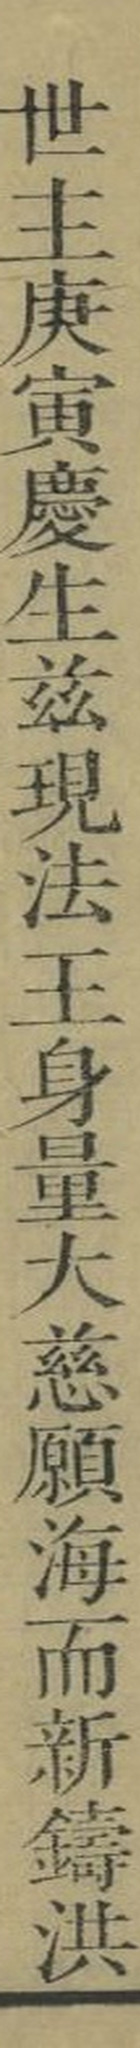世主庚寅慶生茲現法王身量大慈願海而新鑄洪
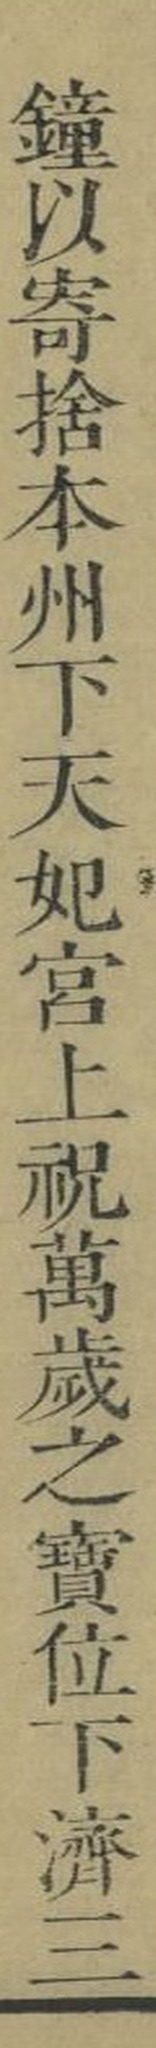鐘以寄捨本州下天妃宮上祝萬歲之寶位下濟三
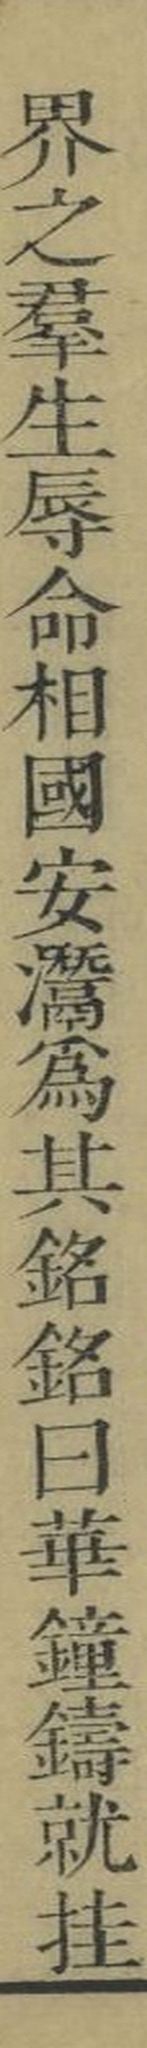界之羣生辱命相國安灊爲其銘銘曰華鐘鑄就挂
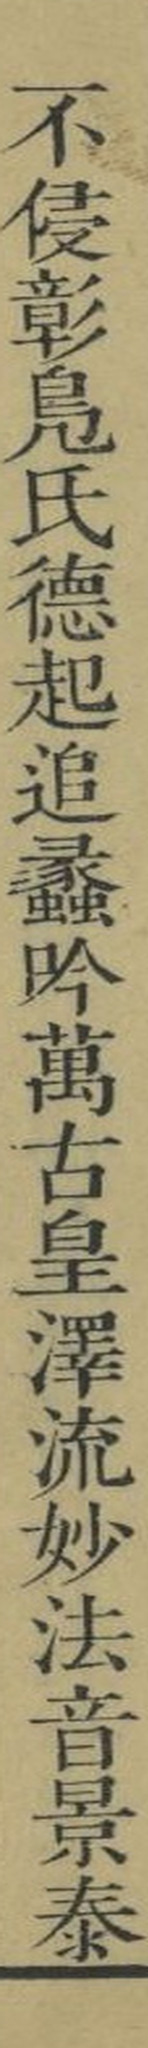不侵彰鳬氏德起追蠡吟萬古皇澤流妙法音景泰
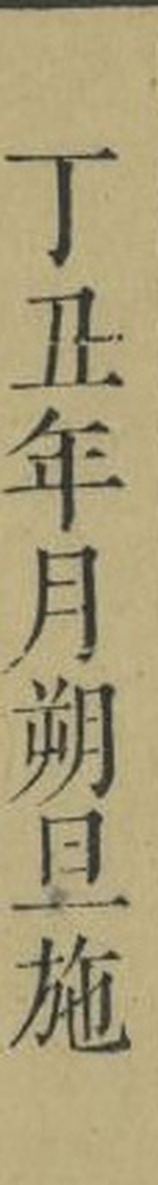丁丑年月朔旦施
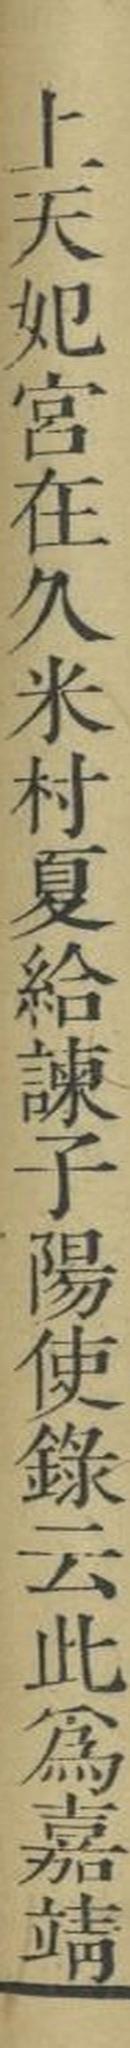上天妃宮在久米村夏給諫子陽使錄云此爲嘉靖
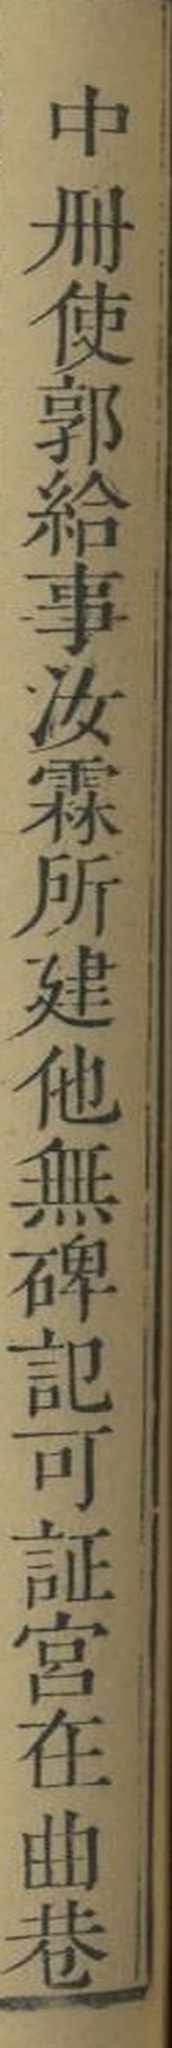中冊使郭給事汝霖所建他無碑記可証宮在曲巷
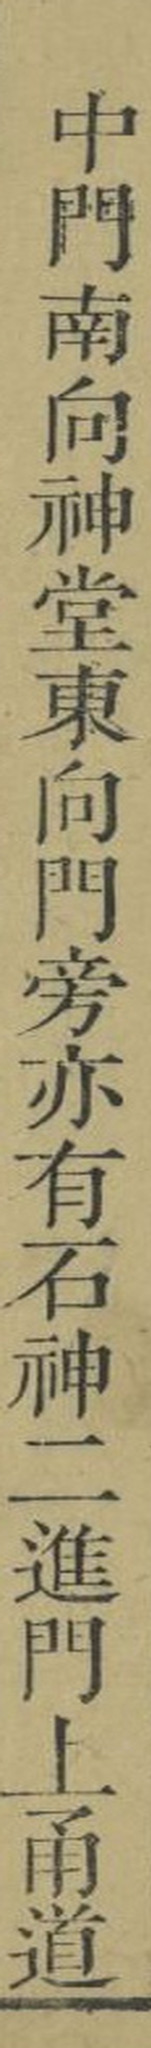中門南向神堂東向門旁亦有石神二進門上甬道
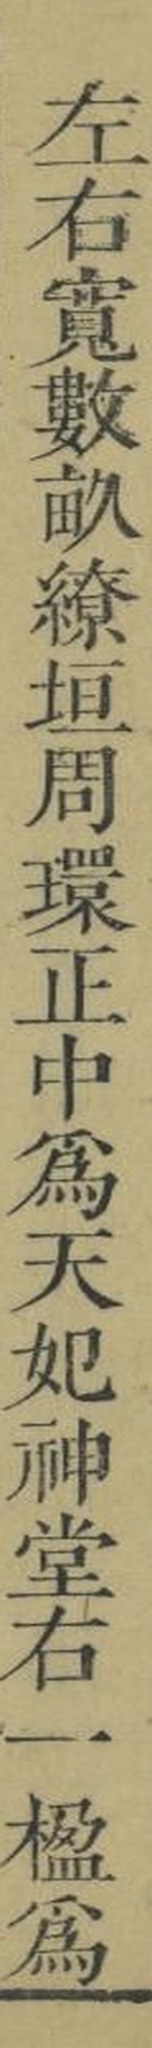左右寬數畝繚垣周環正中爲天妃神堂右一楹爲
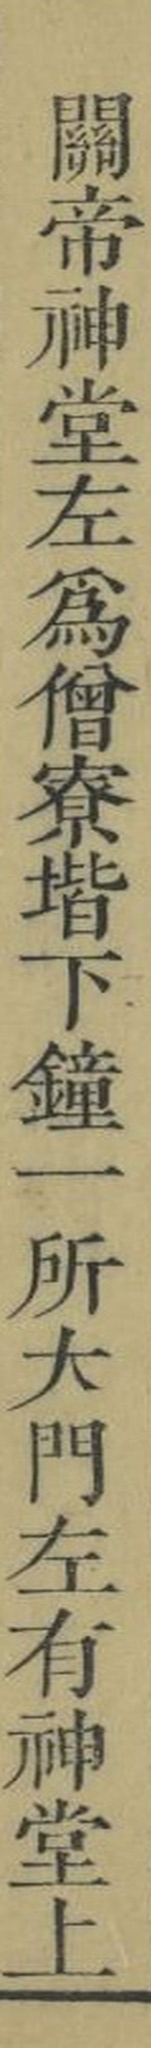關帝神堂左爲僧寮堦下鐘一所大門左有神堂上
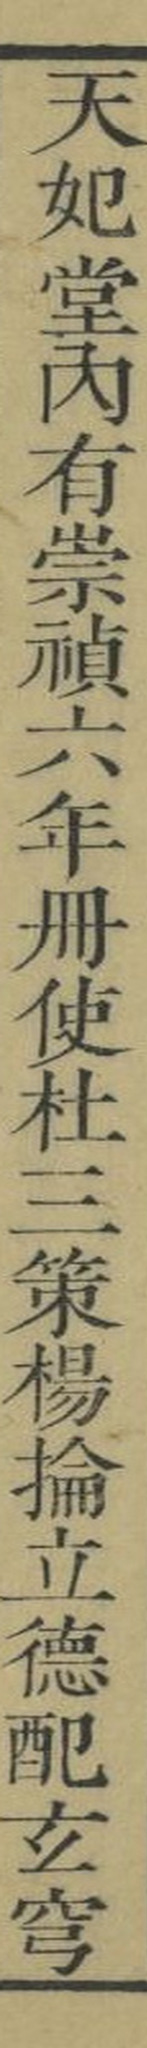天妃堂内有崇禎六年冊使杜三策楊掄立德配玄穹
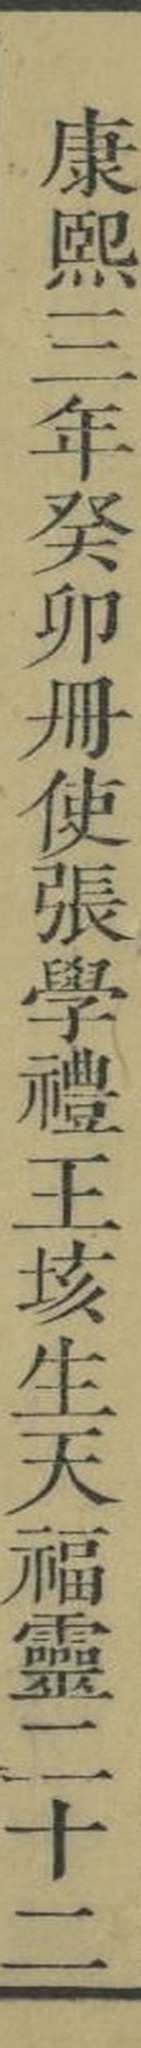康煕三年癸卯冊使張學禮王垓生天福靈二十二
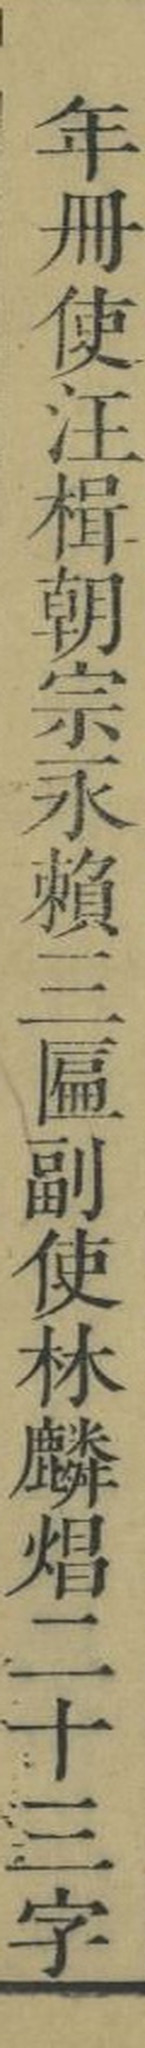年冊使汪楫朝宗永賴三匾副使林麟焻二十三字
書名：中山伝信録 巻二
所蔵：University of the Ryukyus Library
